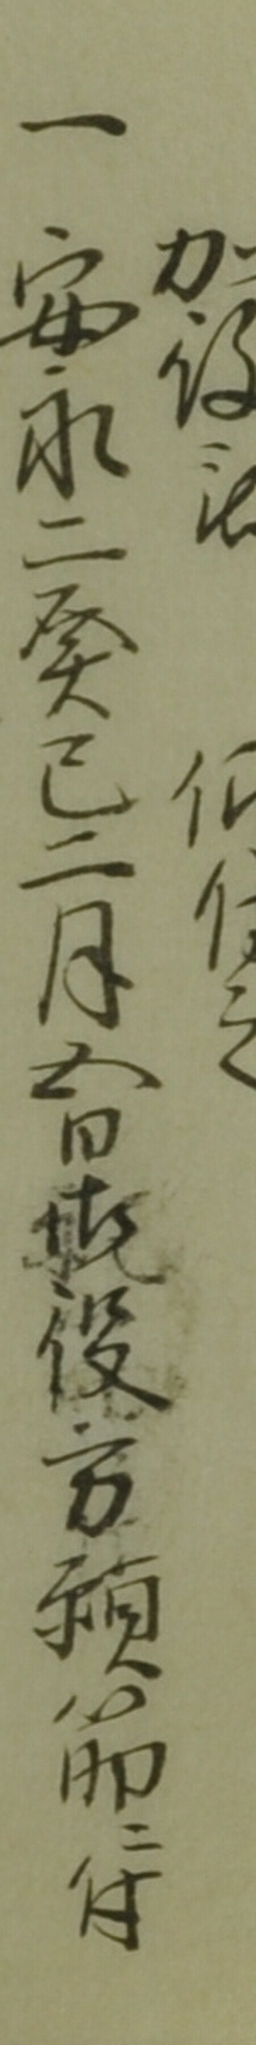一安永二癸巳二月五日御役方願筋付
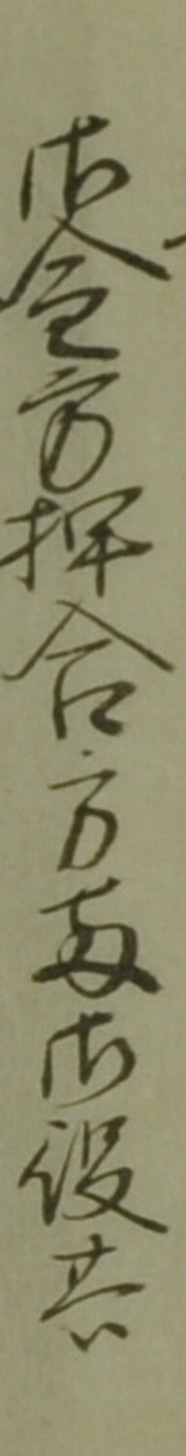御金方押合方両御役共
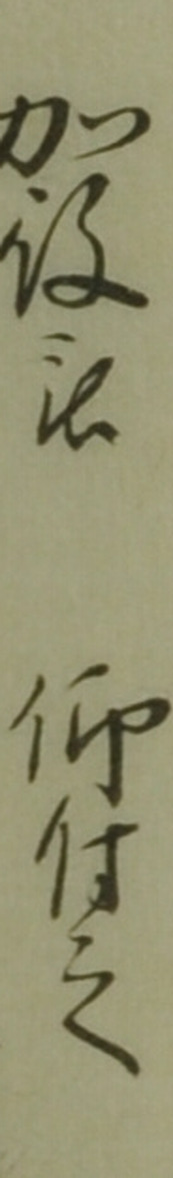加役被仰付之
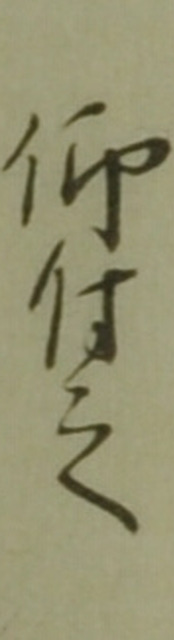仰付之
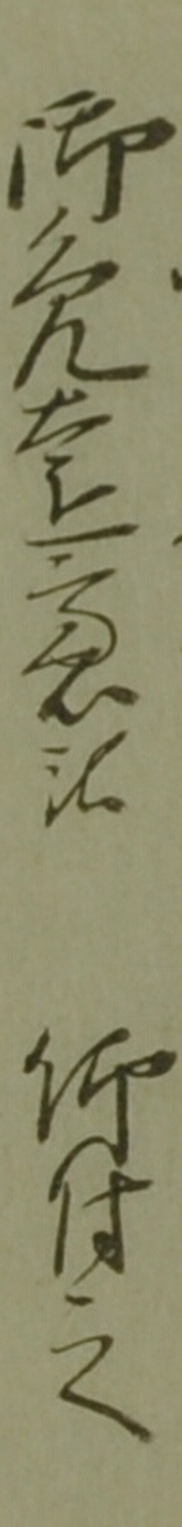御免遠慮被仰付之
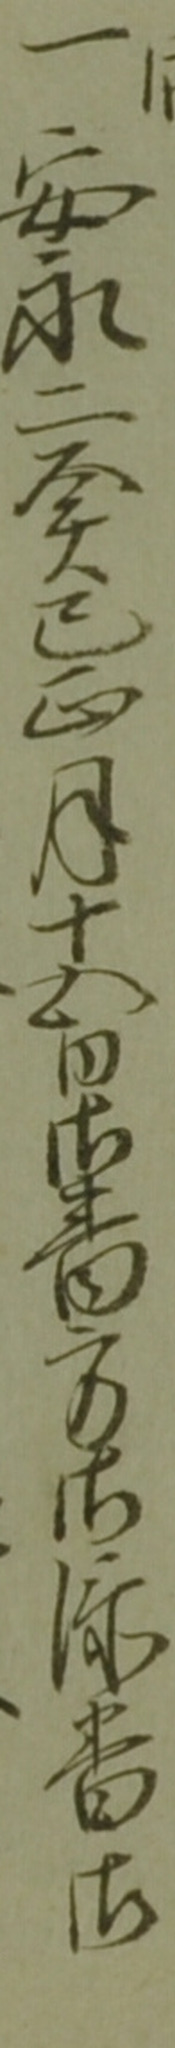一安永二癸巳正月十五日御番方御添番御
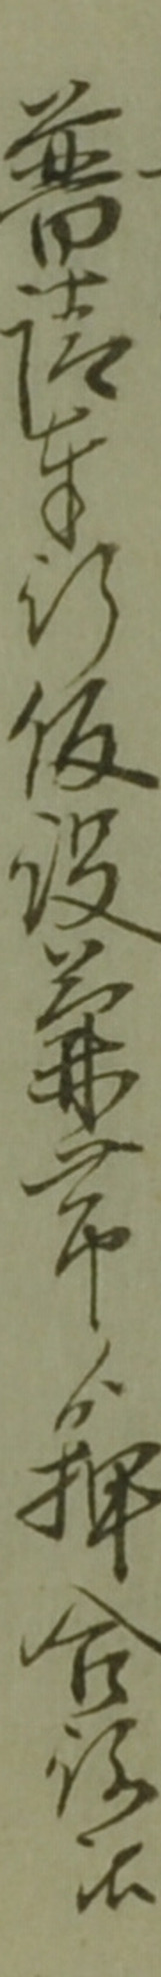普請奉行仮役兼帯ゟ押合役被
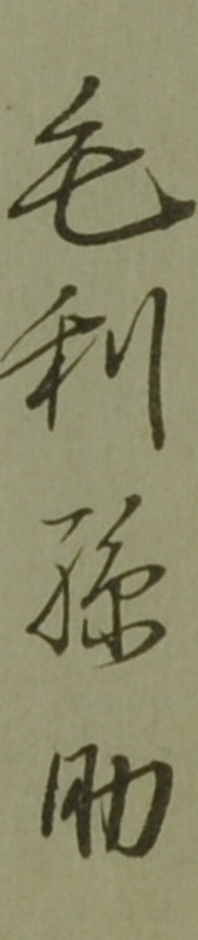毛利孫助
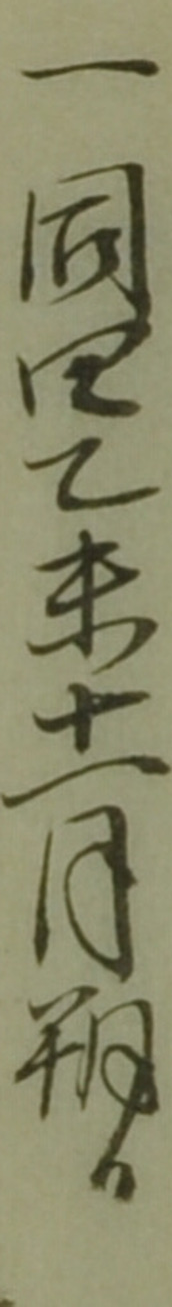一同四乙未十一月朔日
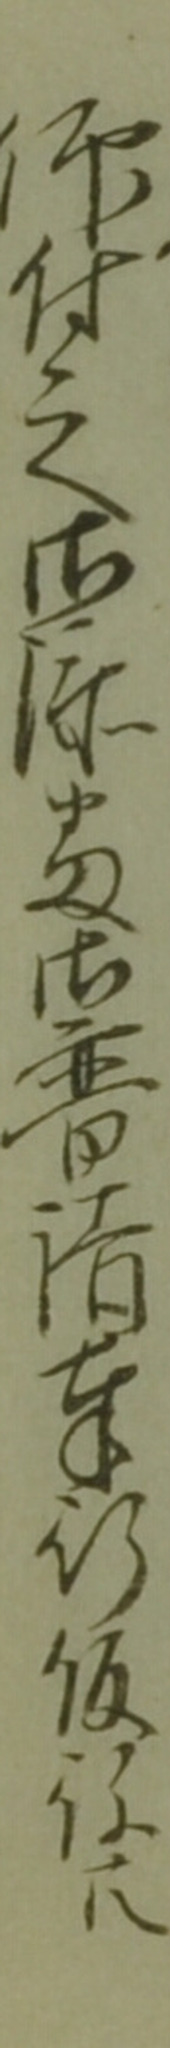仰付之御添番御普請奉行仮役共
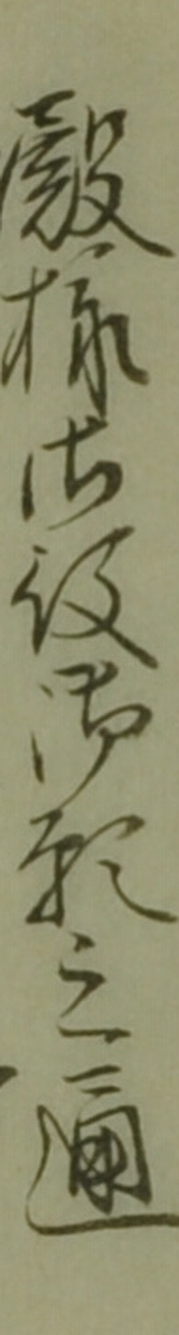殿様御役御願之通
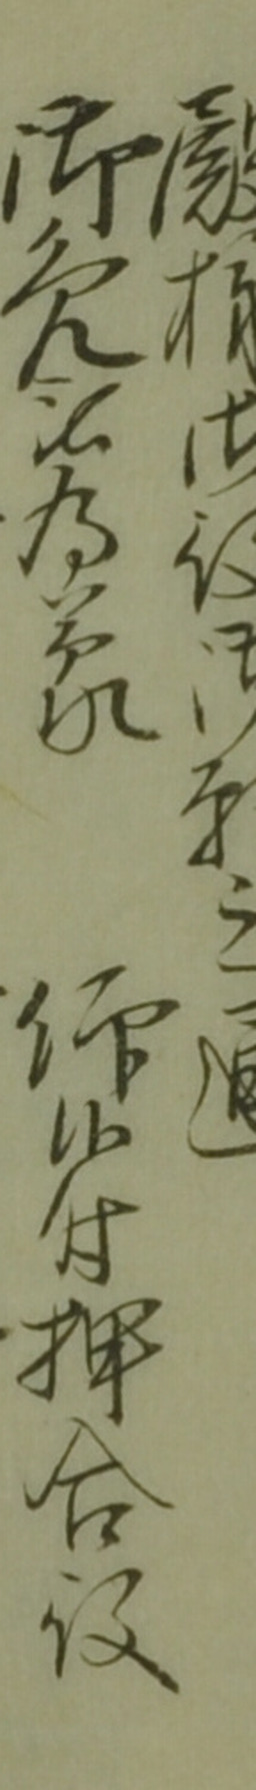御免被為蒙仰候付押合役
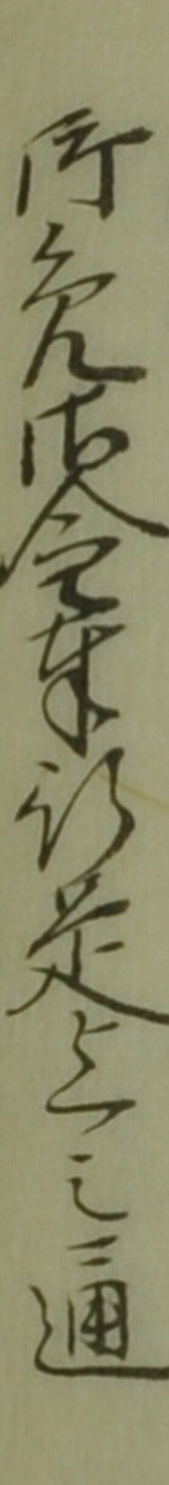御免御金奉行是迄之通
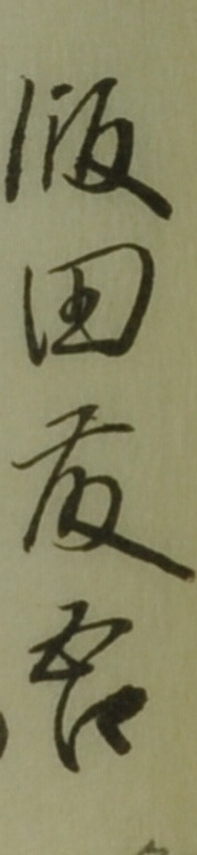飯田藤吾
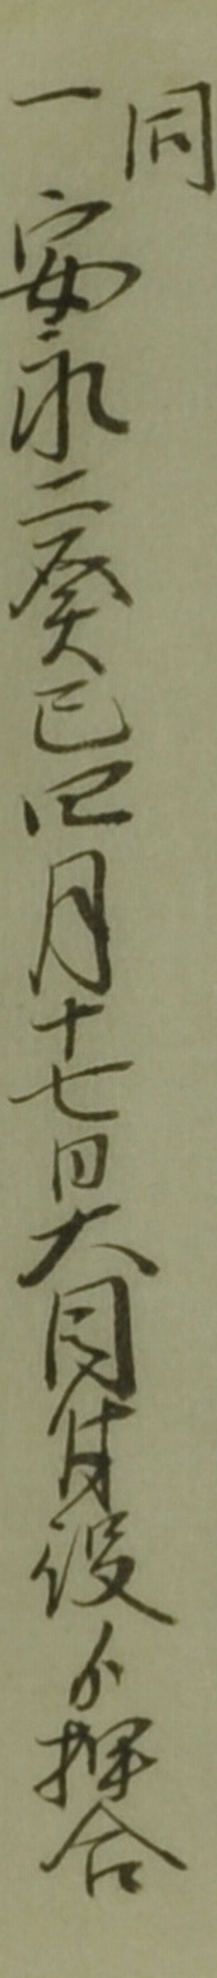一安永二癸巳四月十七日大目付役ゟ押合
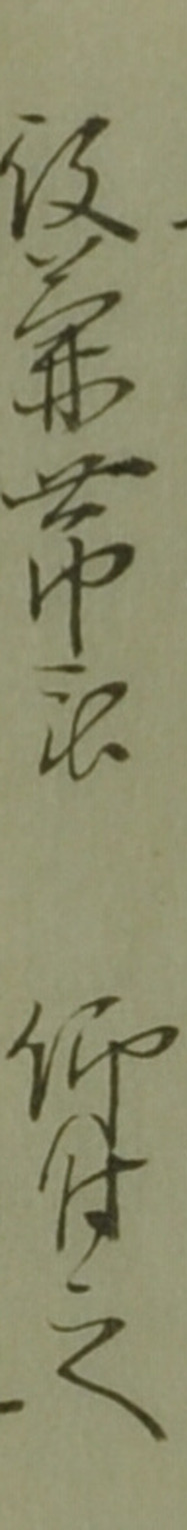役兼帯被仰付之
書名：諸御役代々録（七）
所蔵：伊那市立高遠町図書館・合同会社AMANE
